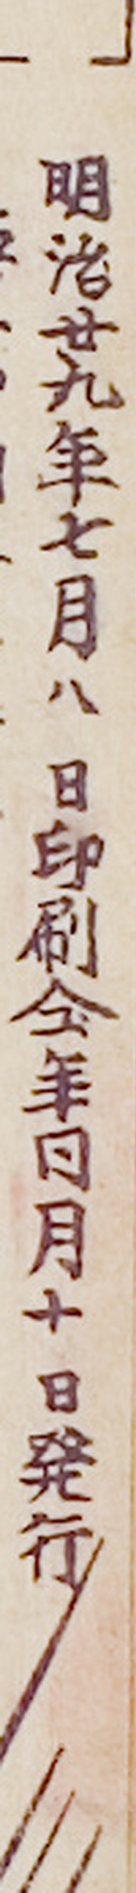北陸三縣明治廿九年七月八日印刷仝年月日十日発行
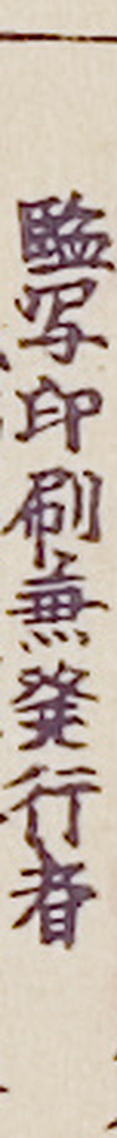画工印刷兼発行者
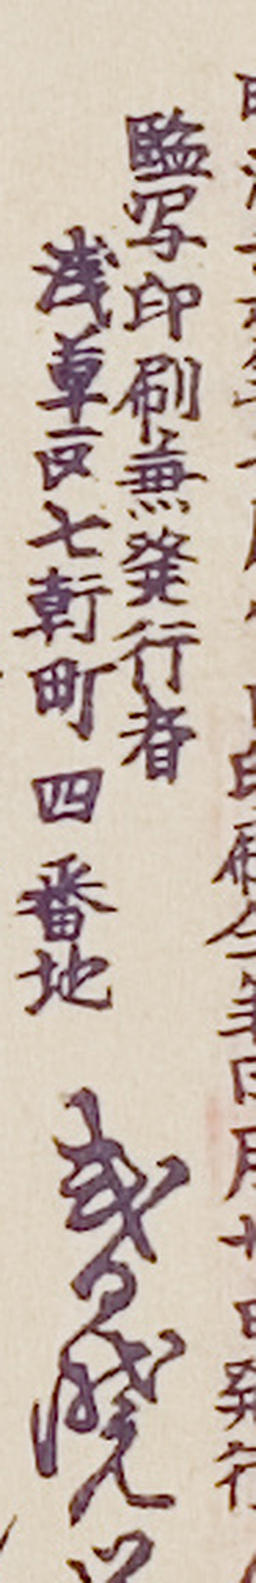浅草區七軒町四番地暮暁筆
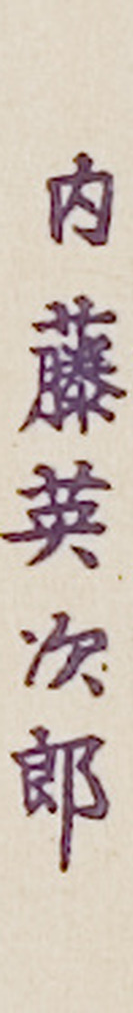内藤英次郎
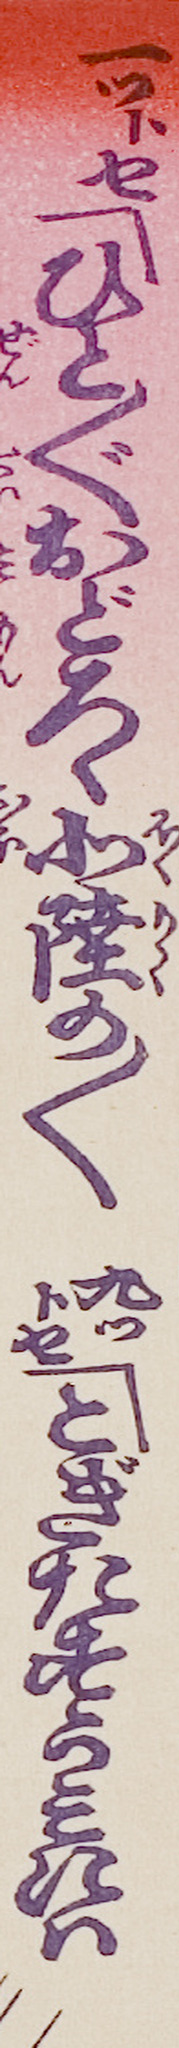一ツトセ乁人〳〵おどろく北陸の〳〵
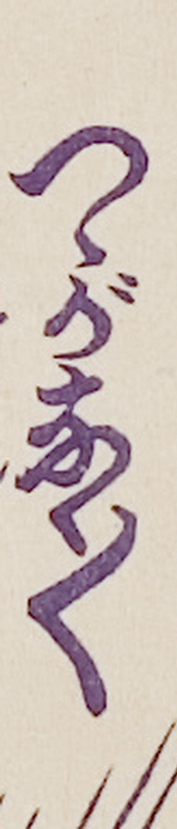つつがなく〳〵
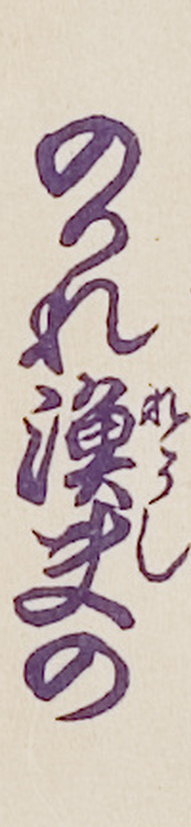のかれ漁使の
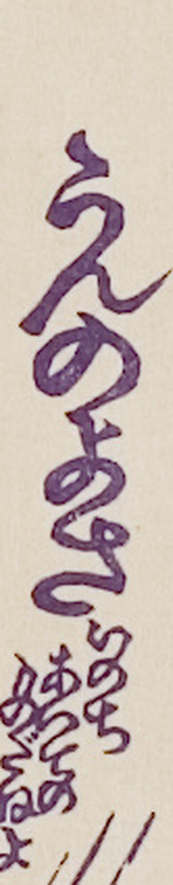うんのよさいのち
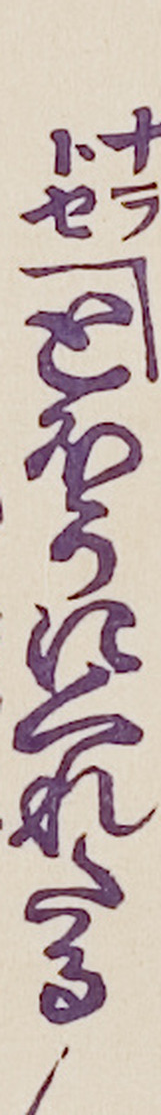十ツトセ乁とほうにくれたる
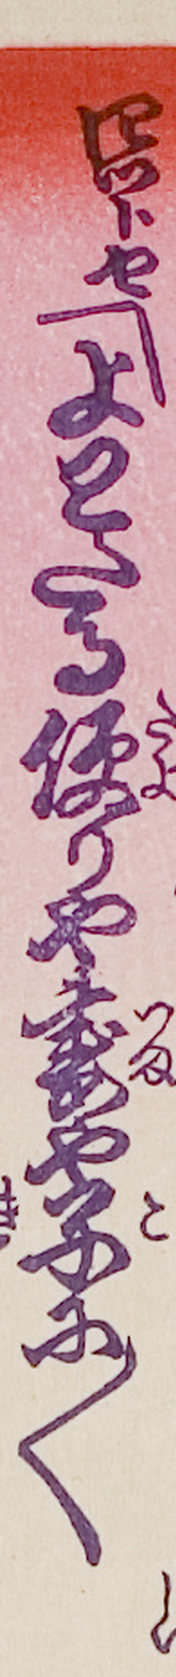四ツトセ乁よりたる便りや妻や子に〳〵
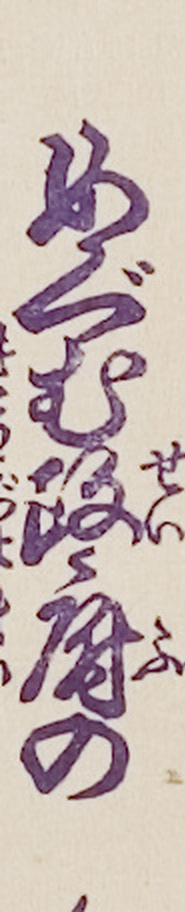めぐむ政府の
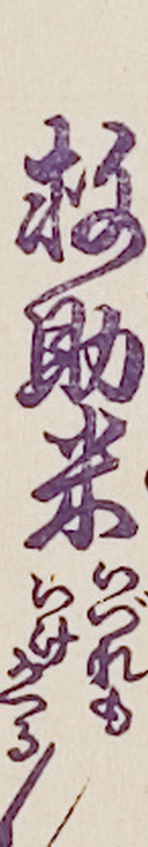救助米いづれも
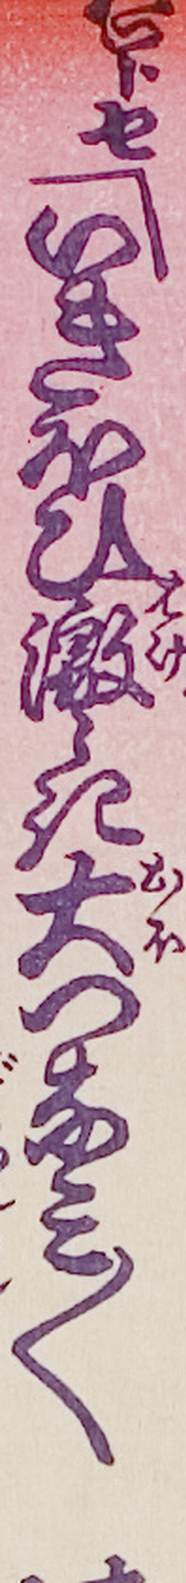五ツトセ乁いきほい激しき大つなミ〳〵
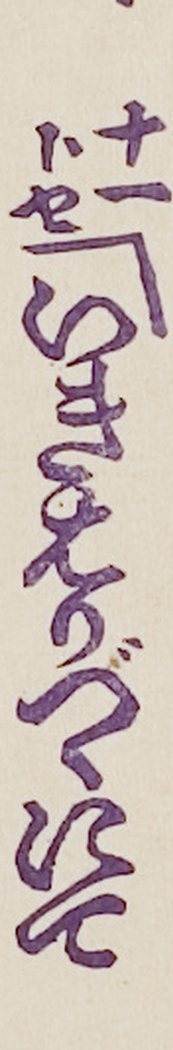十一ツトセ乁いきりづゝにて
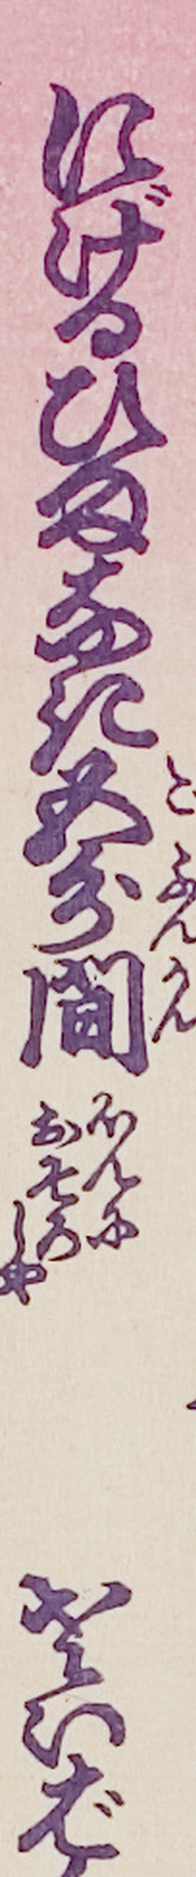にげるひまなき五分間ほんに
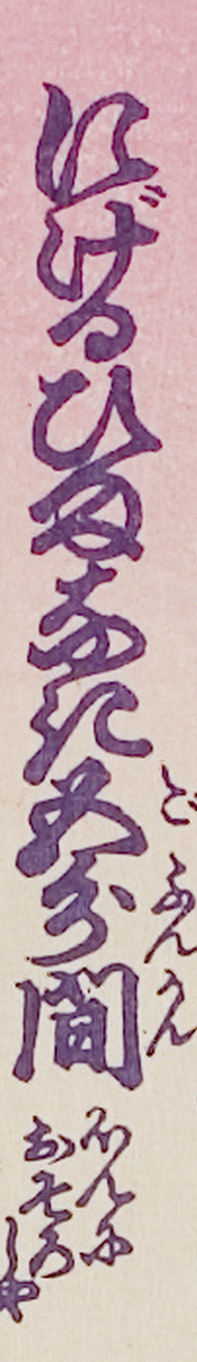にげるひまなき五分間ほんに
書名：北陸三県大つなミ一ツトセぶし
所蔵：東京大学総合図書館 General Library in the University of Tokyo, JAPAN
